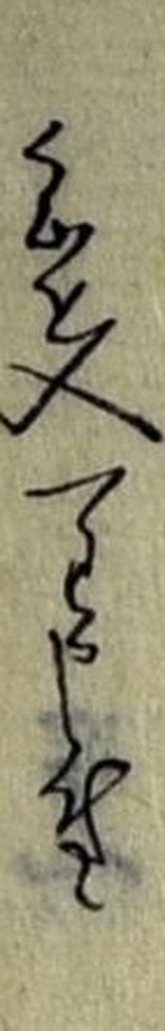念を入可被申付候
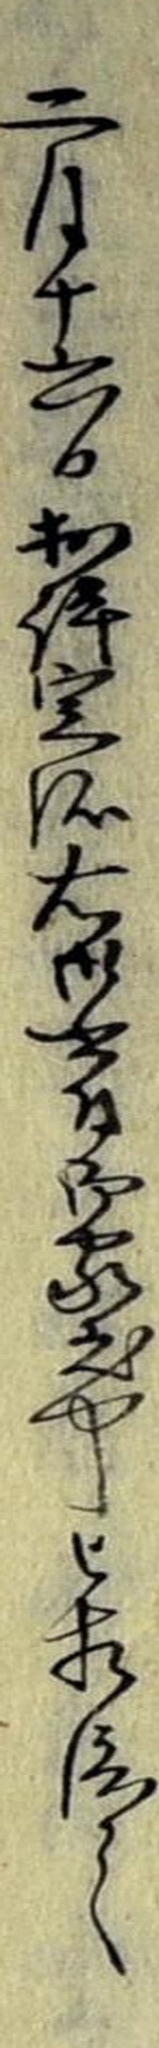二月十六日於評定所右御書付御家老中被相渡之

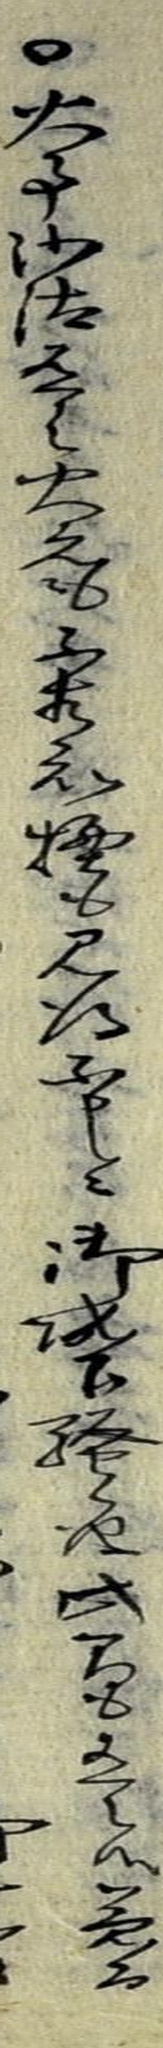〇火事沙汰有之火元も不相知煙も見得不申候ニ御城下騒候儀此間も有之候兼而
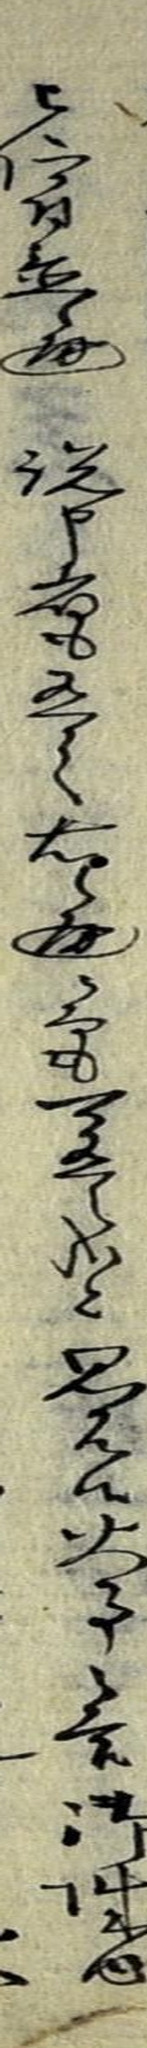被仰付置候通説申者も有之右之通ニ而も可有之哉と思召候火事之節御城内
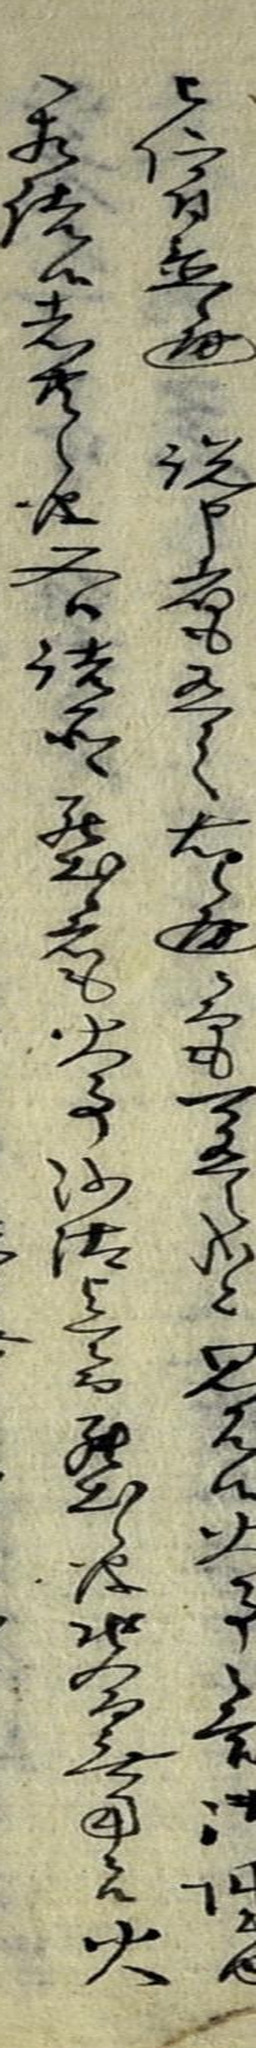へ相詰候者共之儀又ハ諸所へ罷出候者も火事沙汰迄ニ而罷出候儀決而無用ニ候火
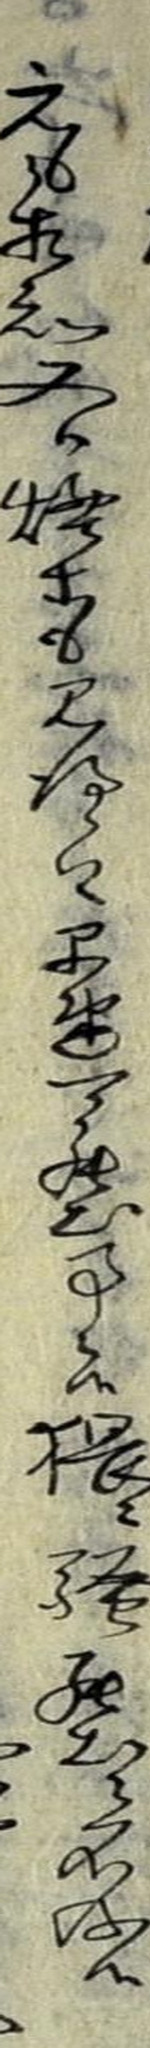元も相知又ハ煙等も見得候ハヽ早速可罷出事ニ候猥ニ騒罷出ニ不及候
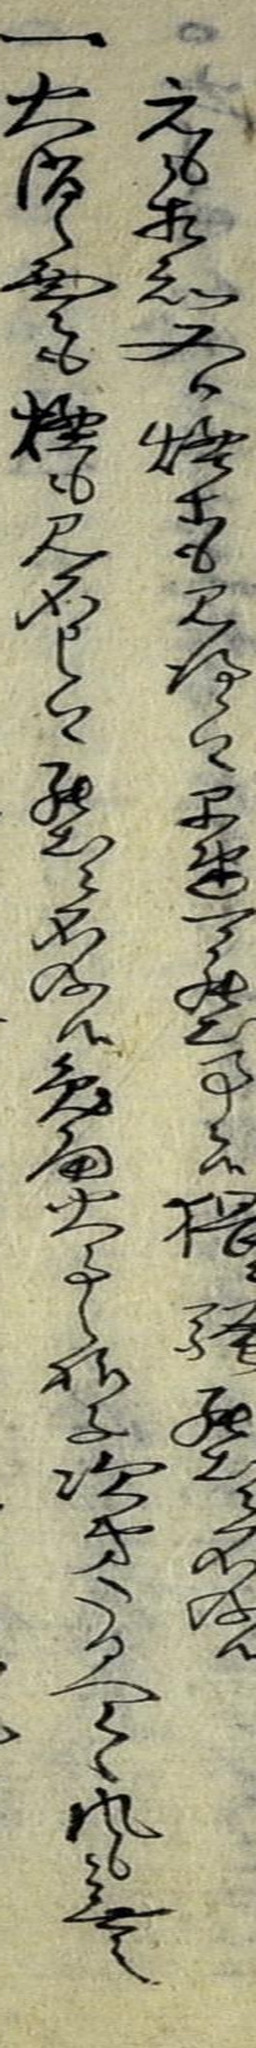一火消之面々も煙も見不申候ハヽ罷出ニ不及候兎角火事之様子次第たるへく候風も無之
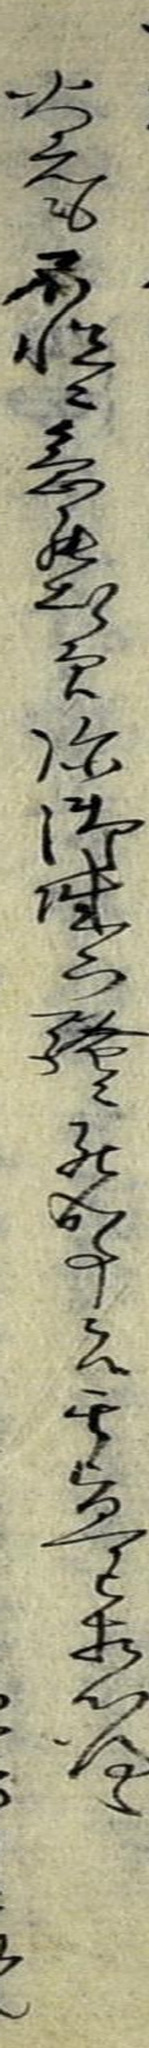火元も不慥ニ急罷出候而ハ弥御城下騒ニ罷成事ニ候其旨可被相心得候
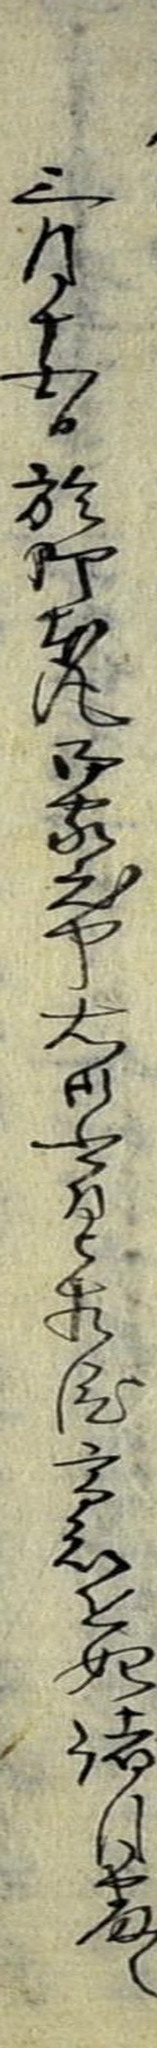三月十五日於御本丸御家老中右御書付被相渡高知を始諸月番之
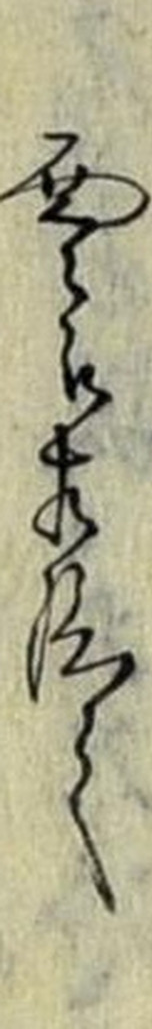面々江相渡之
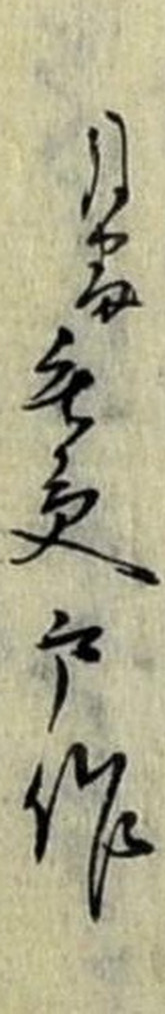月番毛受戸作
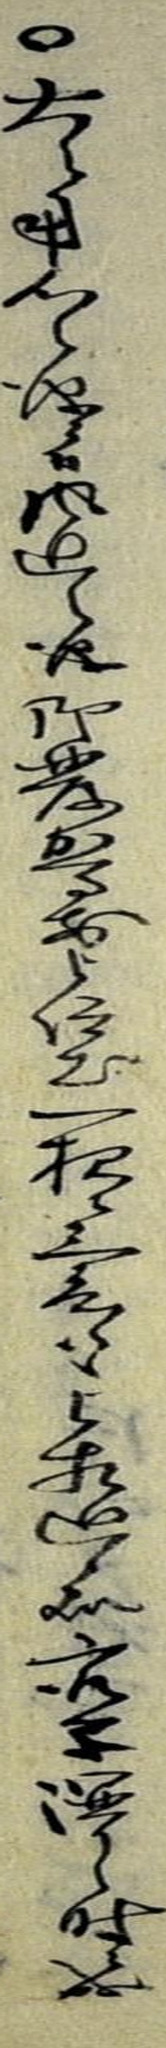〇火之用心之儀ニ付夜廻之儀御発駕前被仰出一夜ニ三度ツヽ被相廻候処最早湿り之
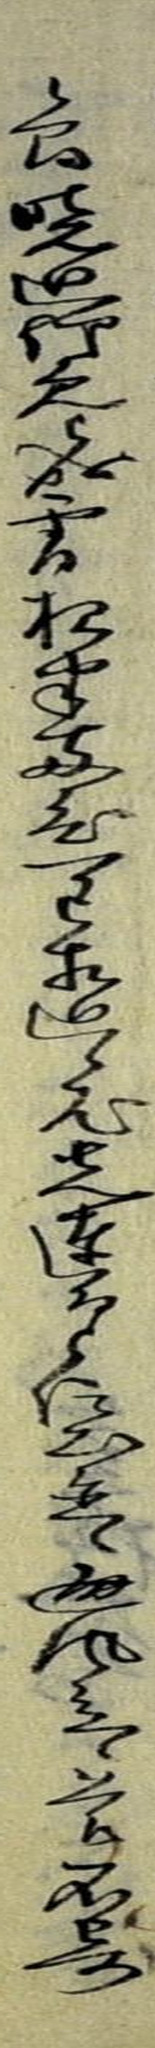候間暁廻御免被成宵夜半両度可被相廻候尤先達而被仰出置候通風立候節不寄
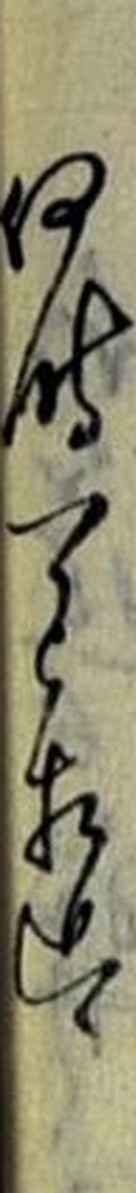何時可被相廻候
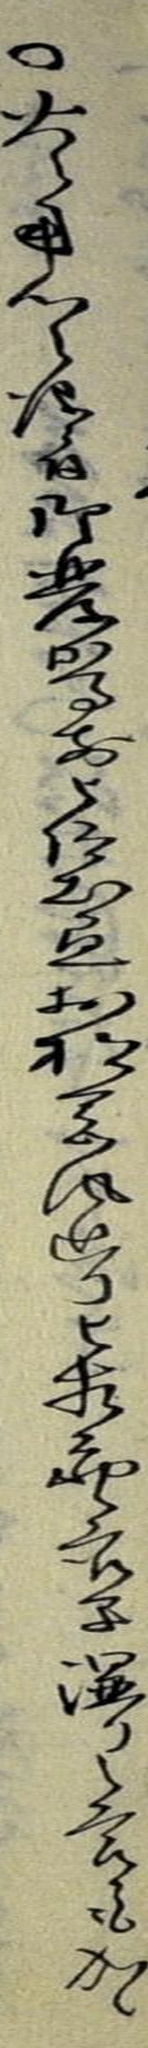〇火之用心之儀ニ付御発駕前被仰出置於松岡風廻り被相勤候最早湿り之節ニも成候
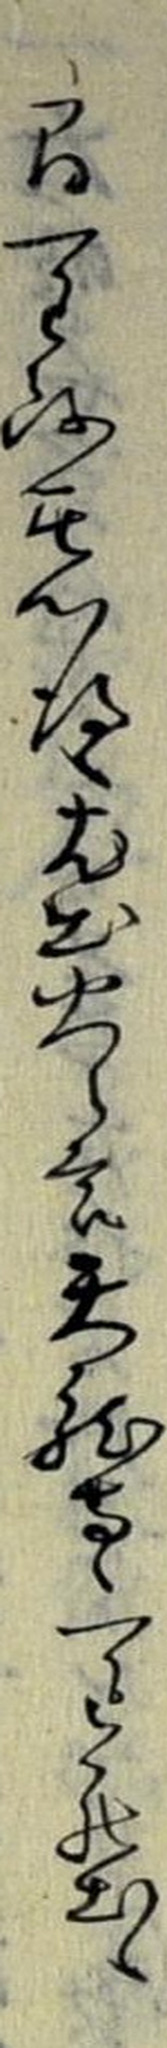間可被致其心得候尤出火之節天徳寺へ可被罷出候
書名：命令之部 一
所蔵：福井県文書館 Fukui Prefectural Archives
